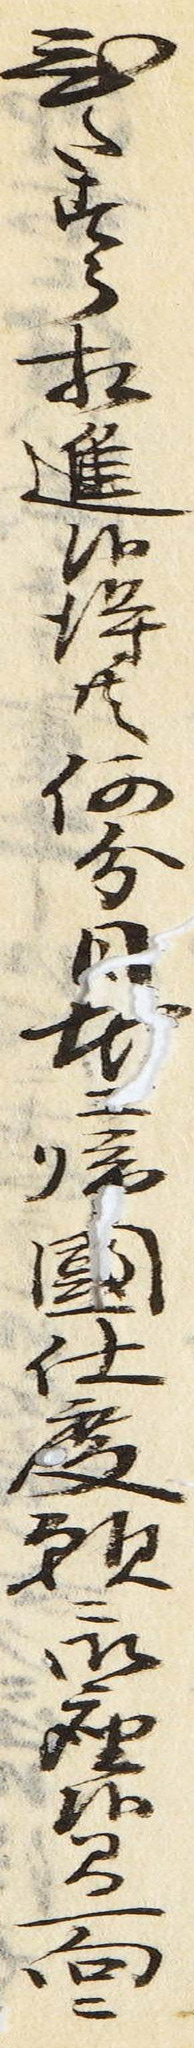ひたすら相進候得共何分日本に帰国仕度願に御座候間一向に
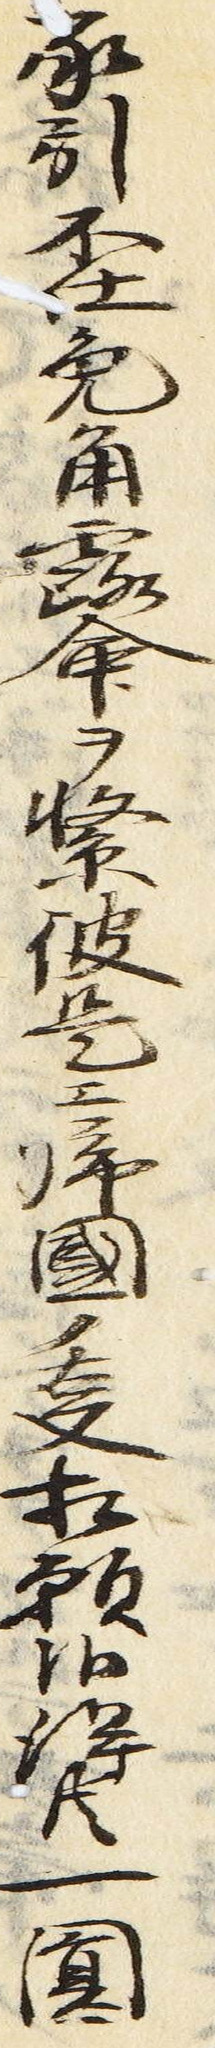承引不仕兎角露命を緊彼是え帰国の事相願候得共一円
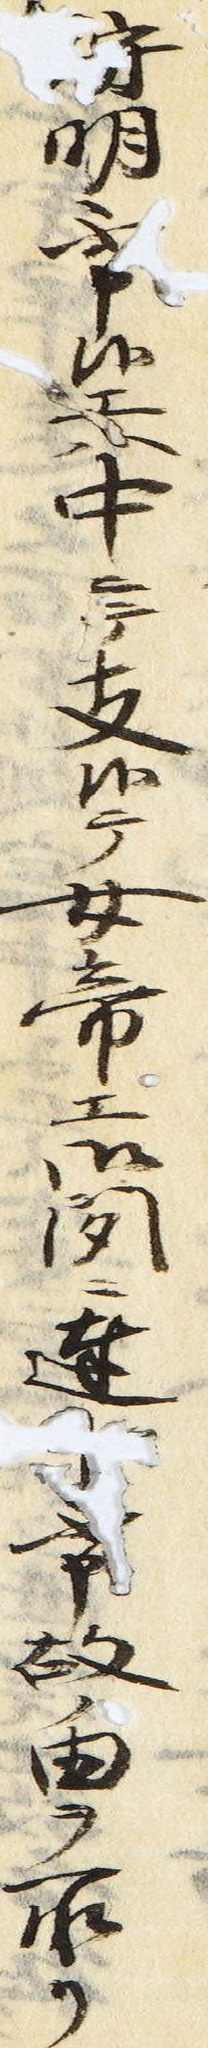埒明不申候えは中にて支候て女帝え御聞に達不申故の由を承り

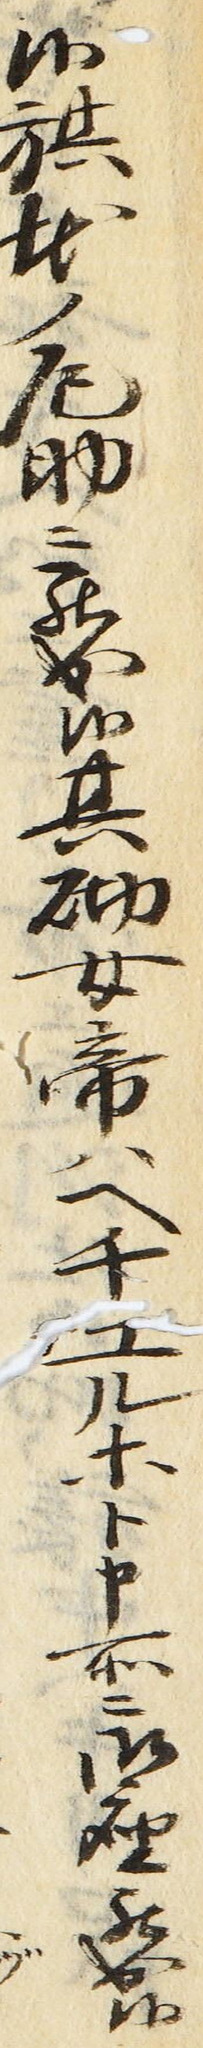候旗本の尼助に罷成候其砌女帝はヘチユルホト申所に御座罷成候
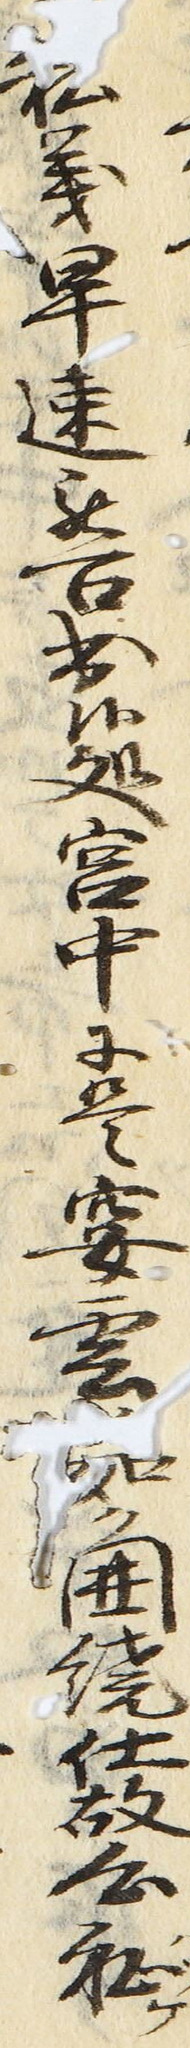私義早速被召出候処宮中には屢雲の如く囲繞仕故心恥け
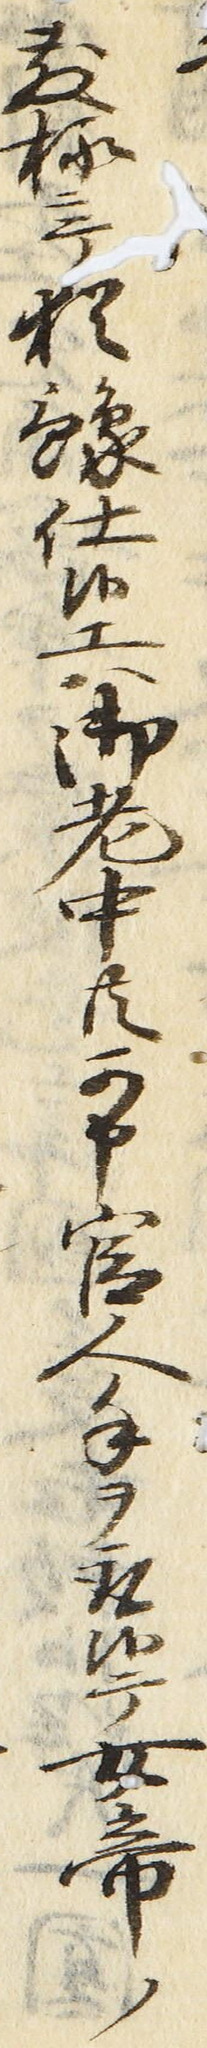敷様にて猶予仕候えは御老中共可申官人手を取候て女帝の
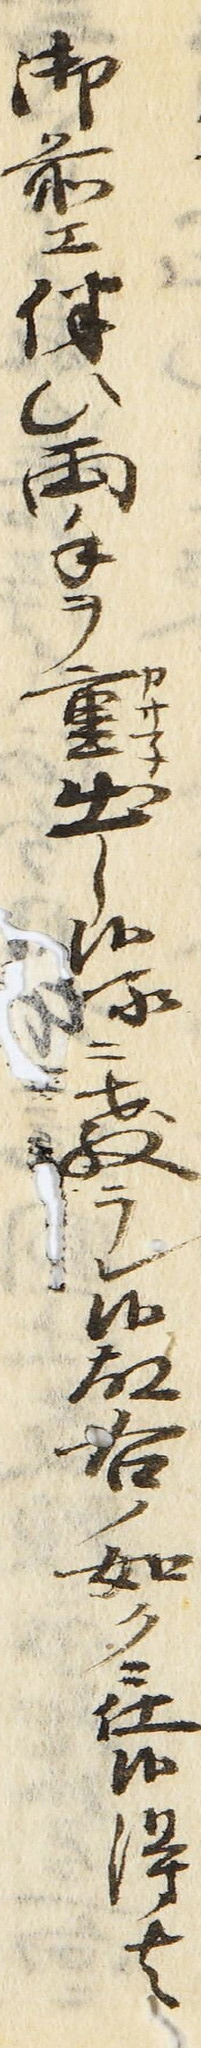御前え伴ひ両手を重出し候様に教られ候故右の如くに仕候得は
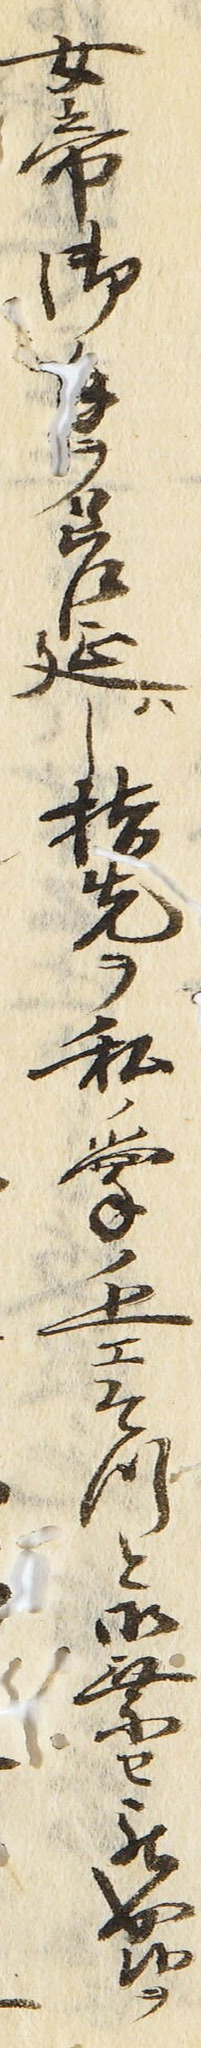女帝御手を差延はし指先を私の掌の上えそつと御乗せ被成候を
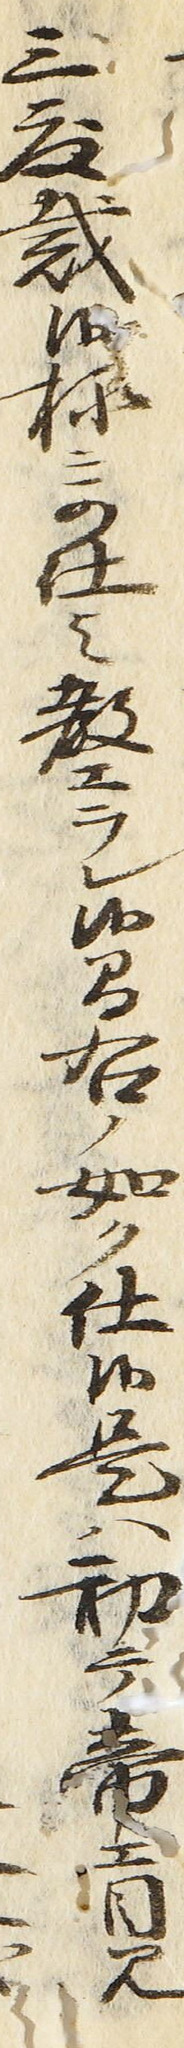三度戴候様に可仕と教えられ候間右の如く仕候是は初て帝え目見
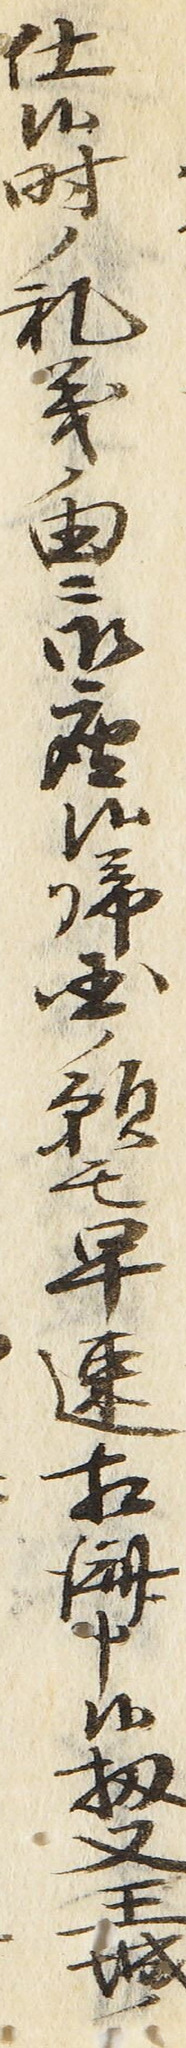仕候時の礼義の由に御座候帰国願も早速相済申候扨又王城の
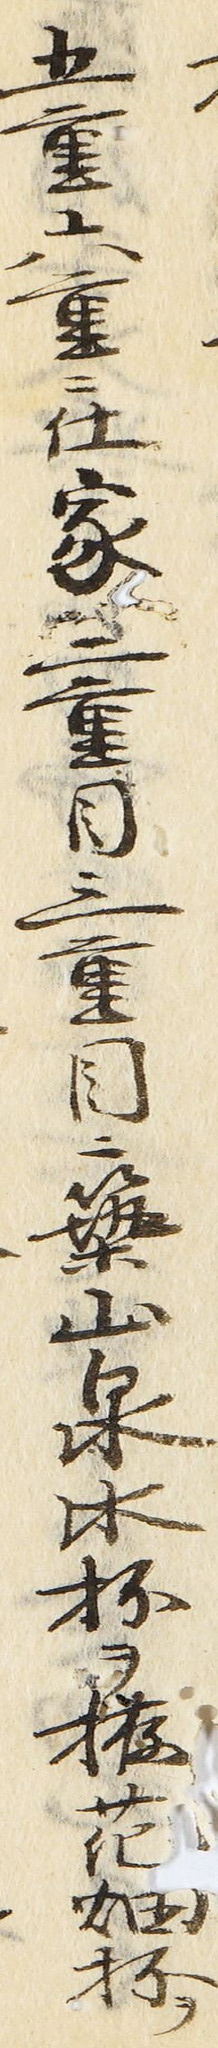五重六重に仕家二重目三重目に築山泉水抔を拵花畑抔を
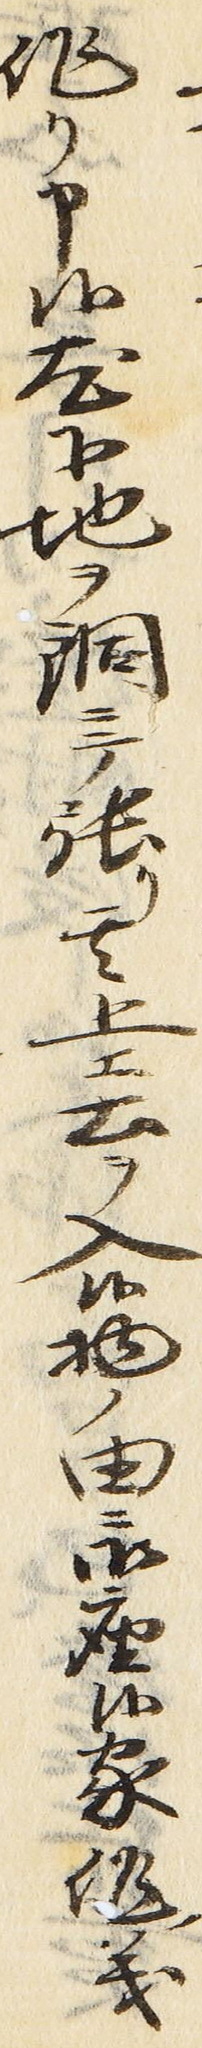作り申候尤下地を銅にて張り其上え土を入候物の由に御座候家作の義
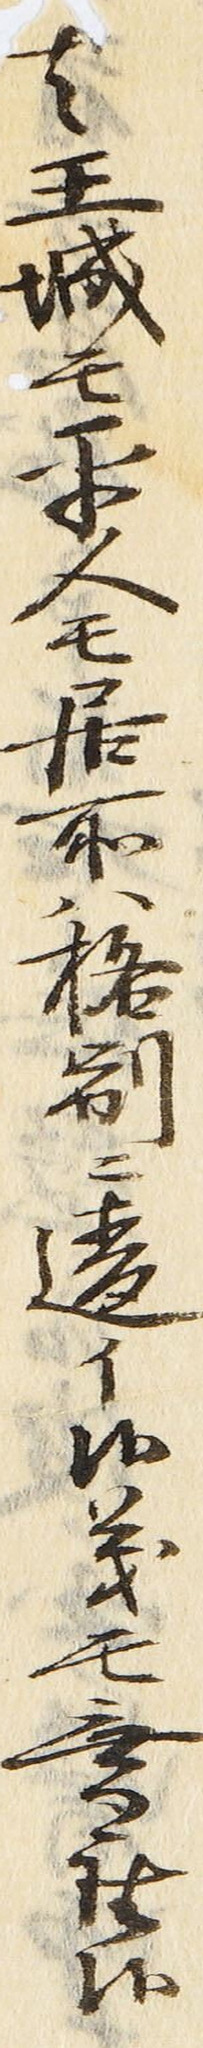は王城も平人も居所は格別に違い候義も無御座候
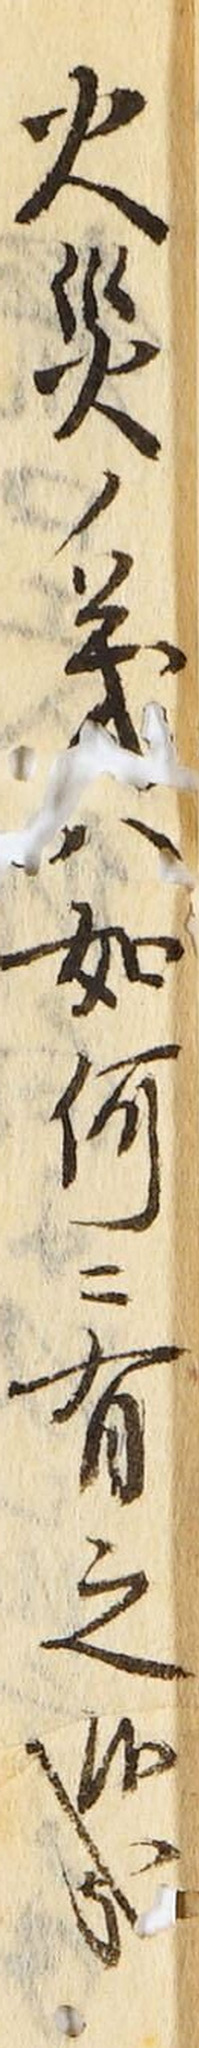火災の義は如何に有之候哉
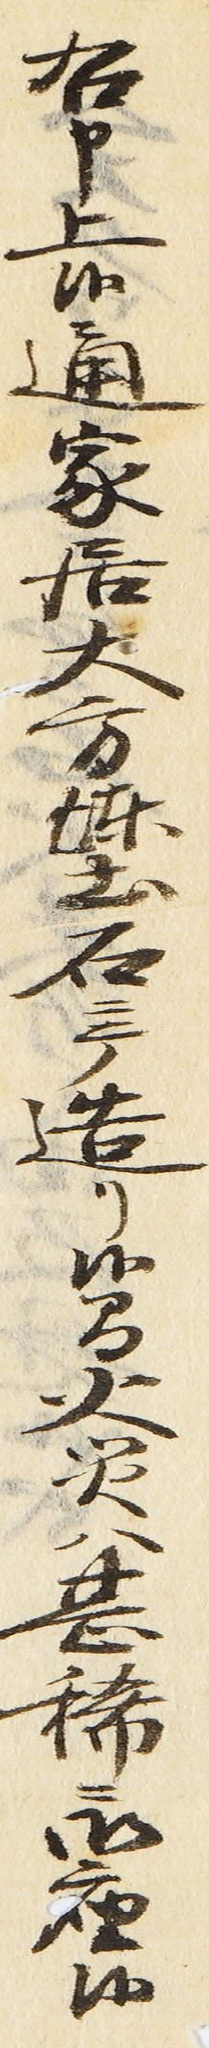右申上候通家居大方煉土石にて造り候間火災は甚稀に御座候
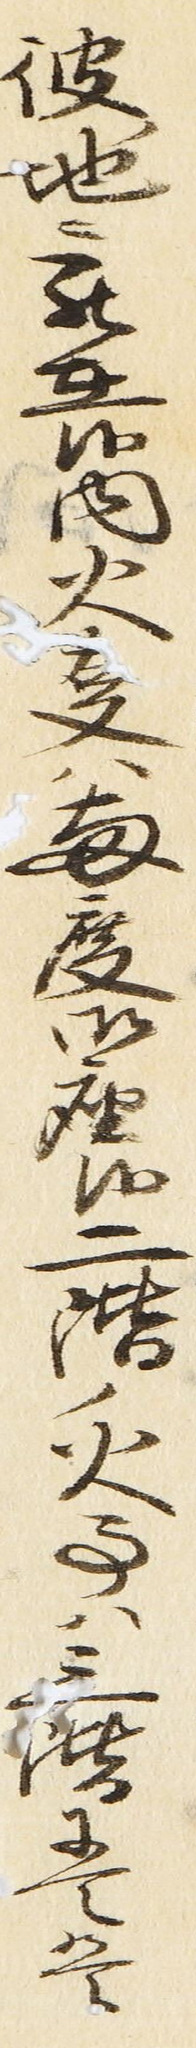彼の地に罷在候内火事は両度御座候二階の火事は三階にては
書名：神昌丸漂流問答
